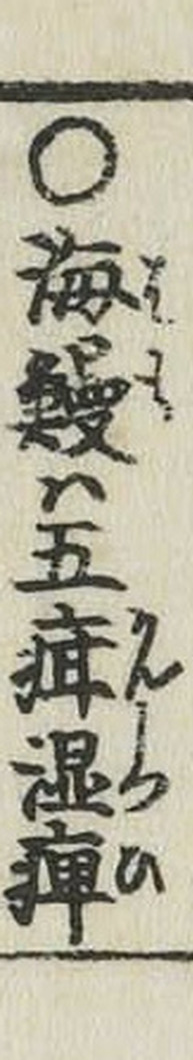○海鰻は五疳湿痺
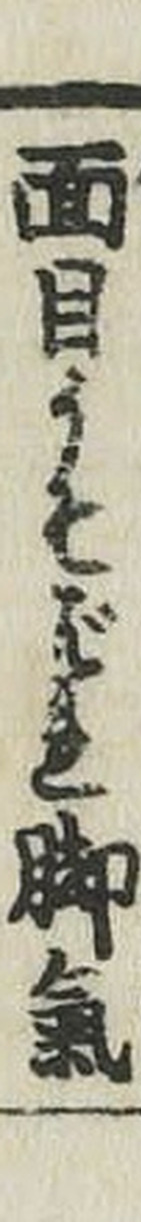面目うそばれ脚気

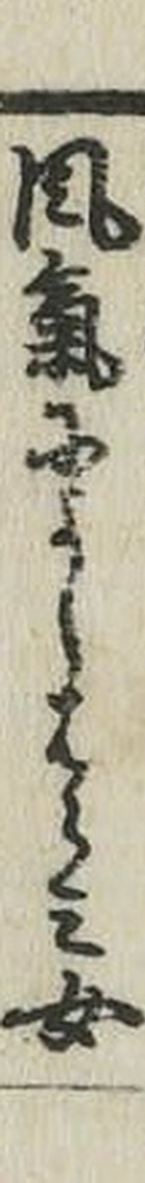風気によしはらみ女
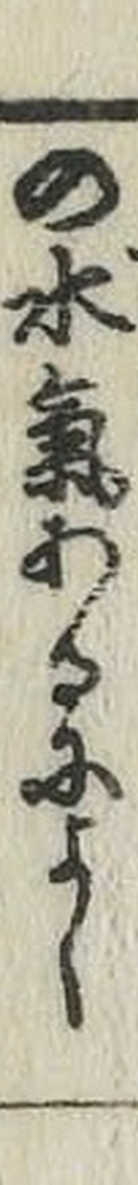の水気あるによし
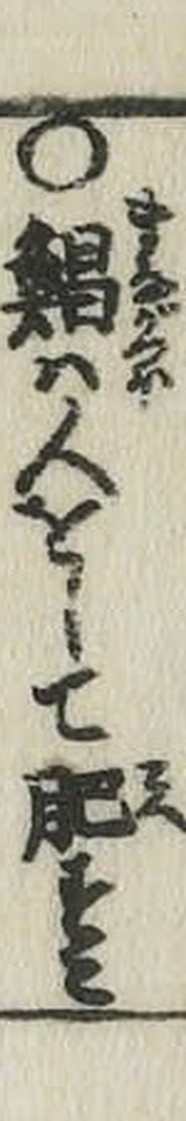○鯧は人をして肥すこ
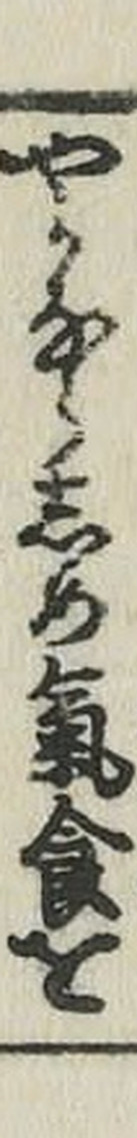やかならしめ気食を
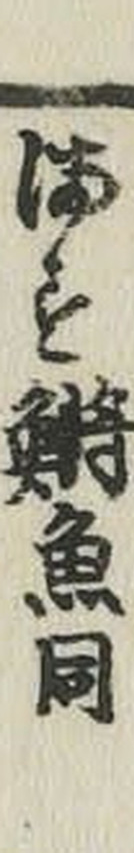ます鱂魚同
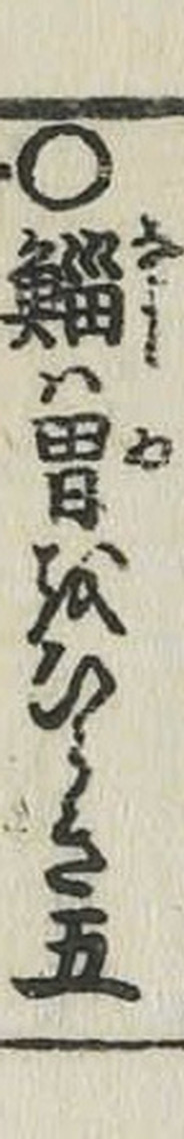○鯔は胃をひらき五
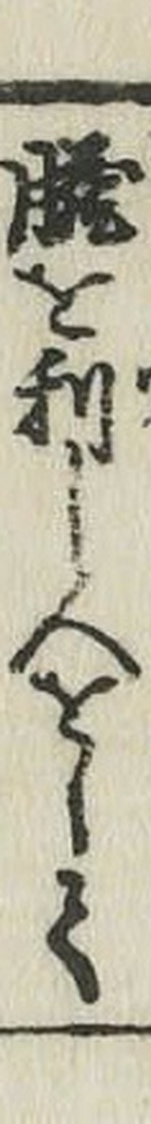臓を利し人をして
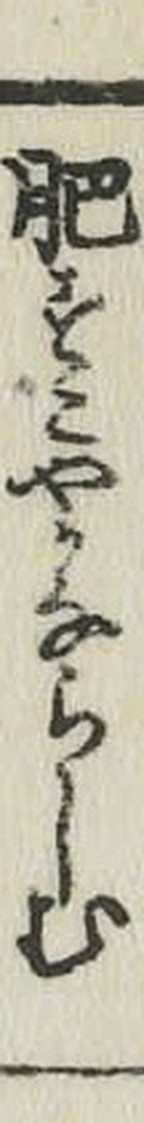肥すこやかならしむ
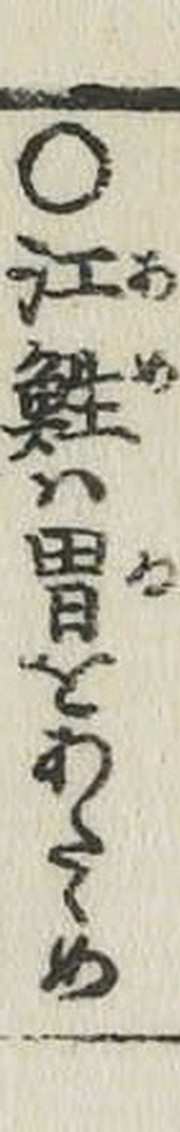○江鮏は胃をあたゝめ
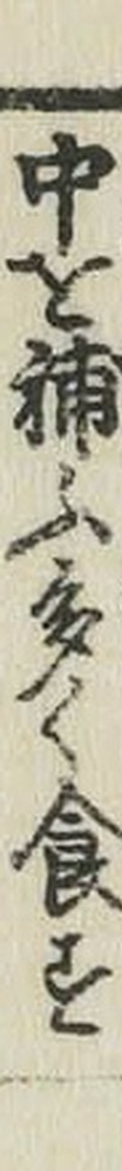中を補ふ多く食す
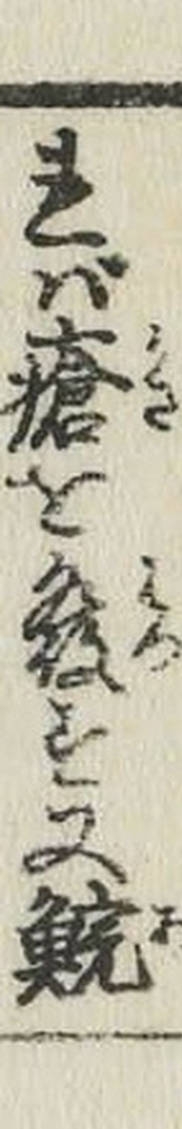れば瘡を発す又鯇
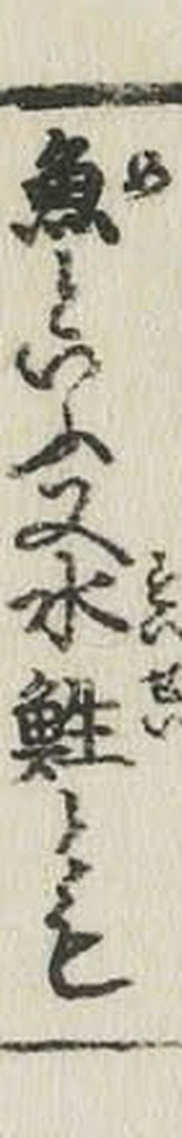魚といふ又水鮏とも
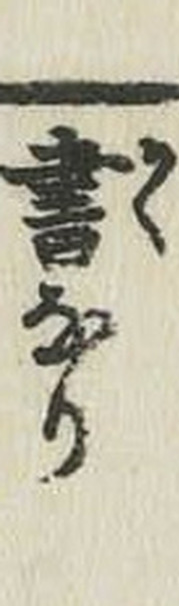書なり
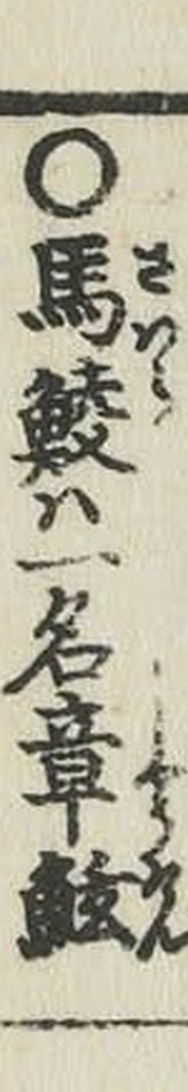○馬鮫は一名章鮌
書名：増補頭書訓蒙図彙大成 10巻 7:巻之14-16
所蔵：東京学芸大学教育コンテンツアーカイブ
